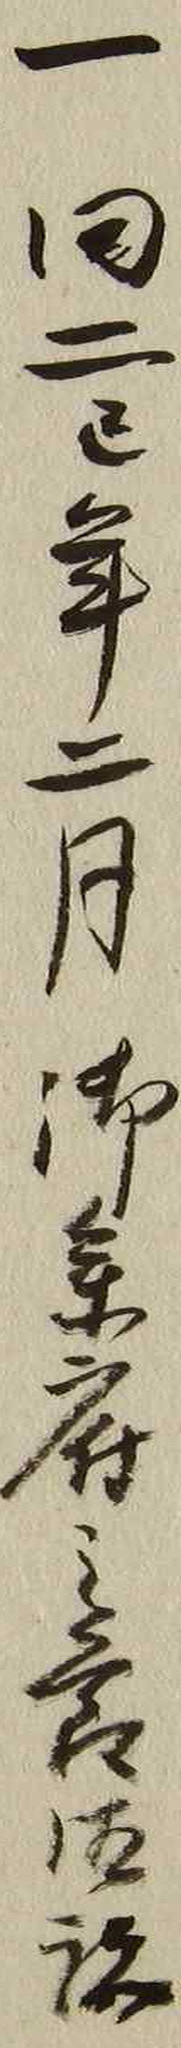一同二巳年二月御参府之節御跡
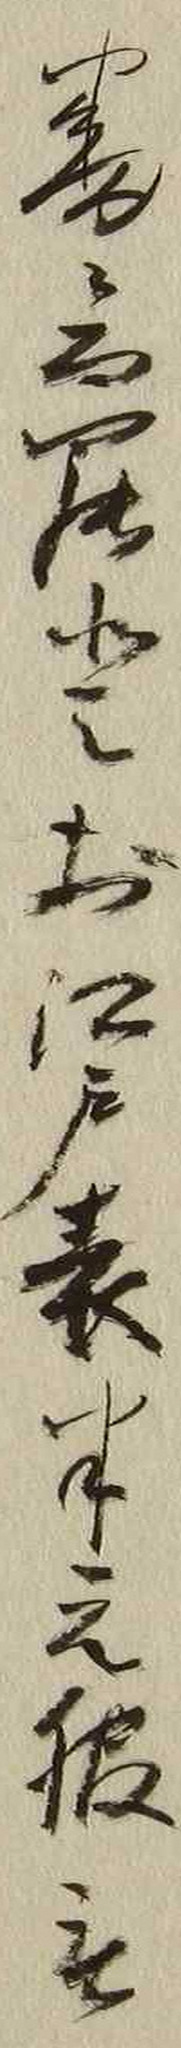番ニ而罷登於江戸表半元服被
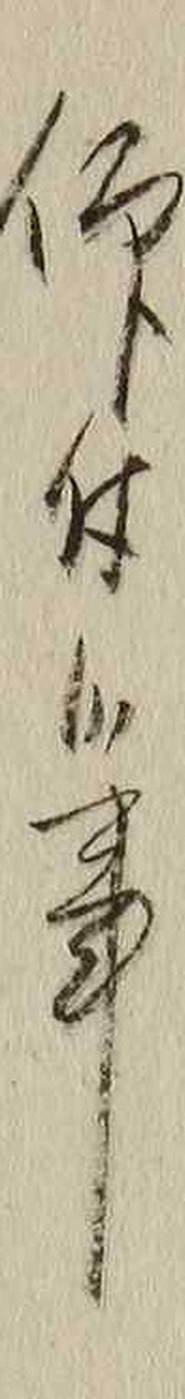仰付候事
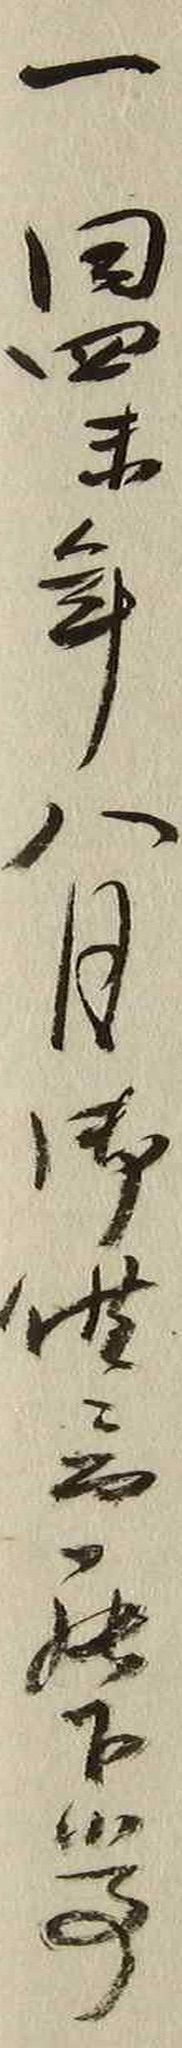一同四未年八月御供ニ而罷下候事
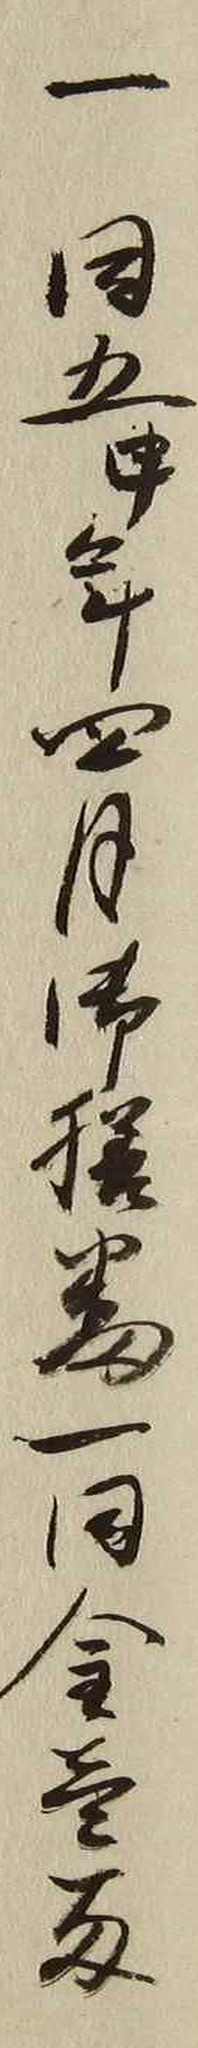一同五申年四月御膳番一同金壱両
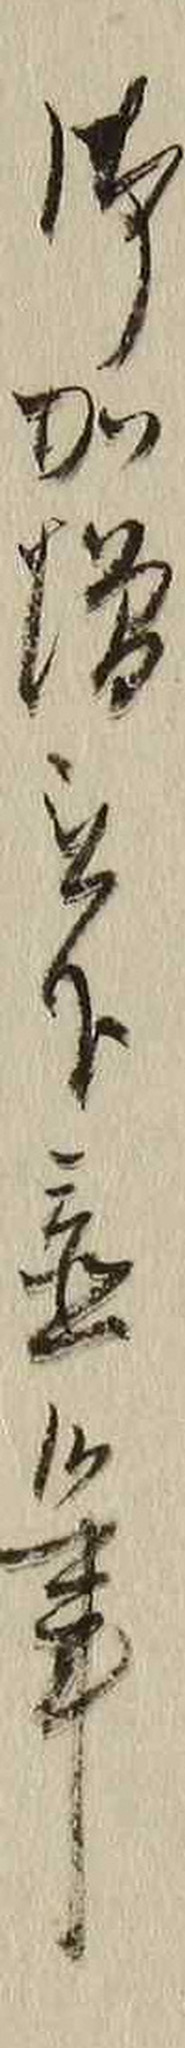御加増被下置候事
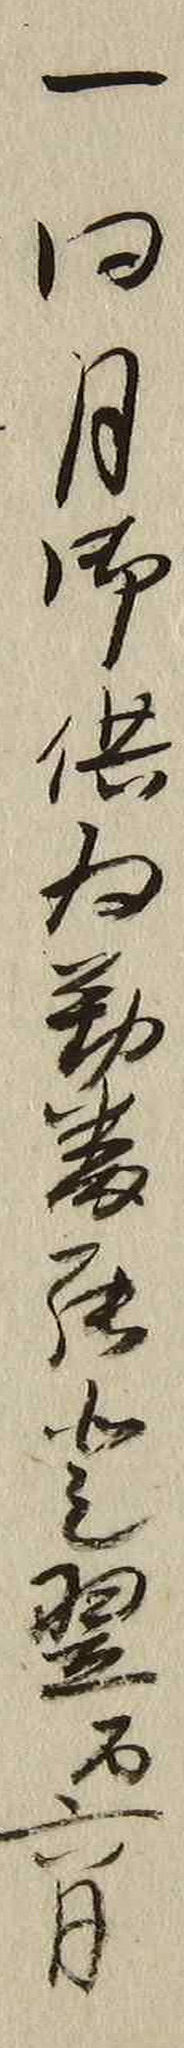一同月御供為勤番罷登翌酉六月
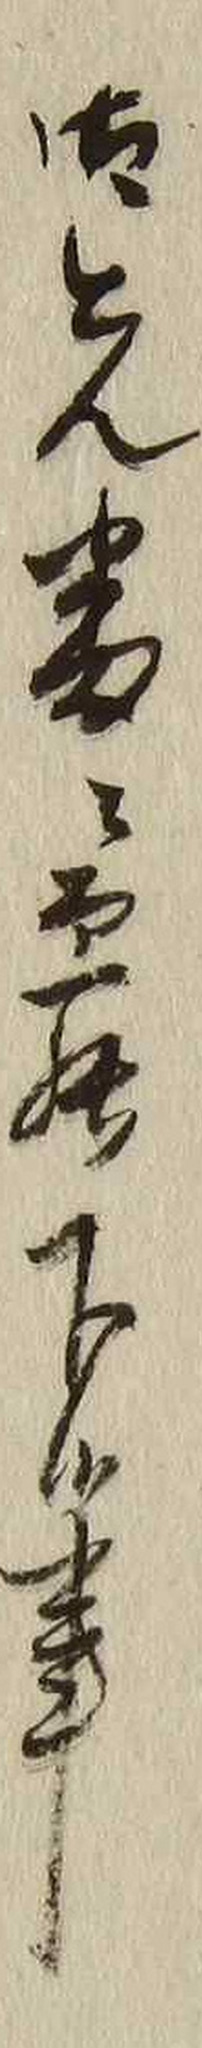御先番ニ而罷下候事
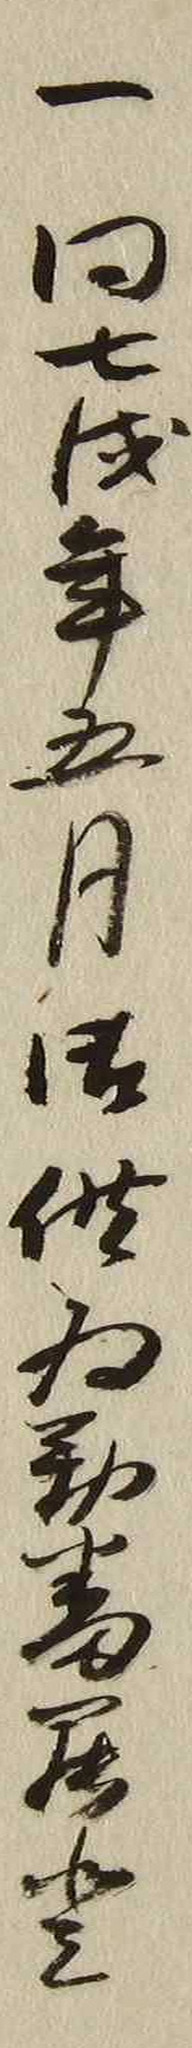一同七戌年五月御供為勤番罷登
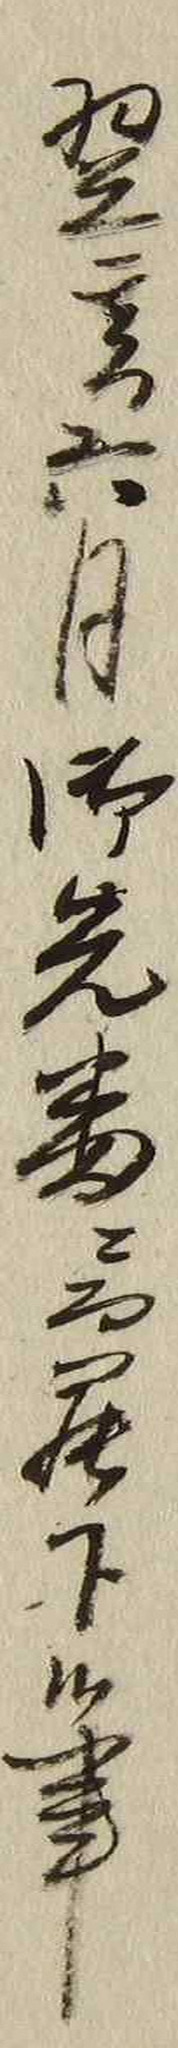翌亥六月御先番ニ而罷下候事
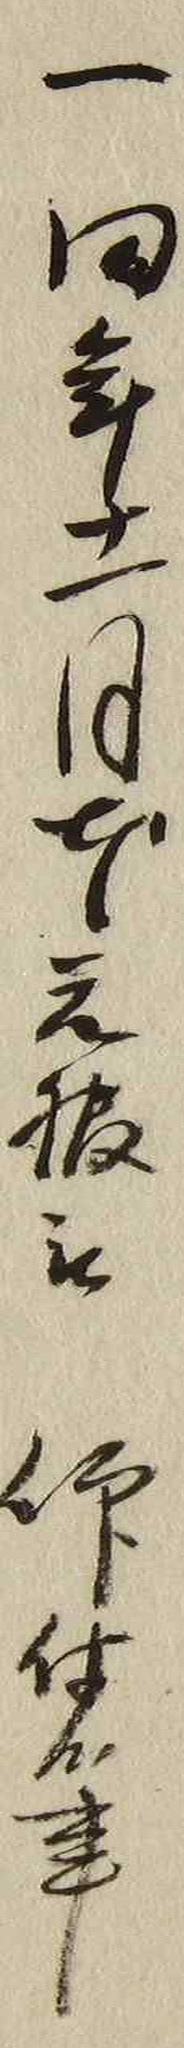一同年十一月本元服被仰付候事
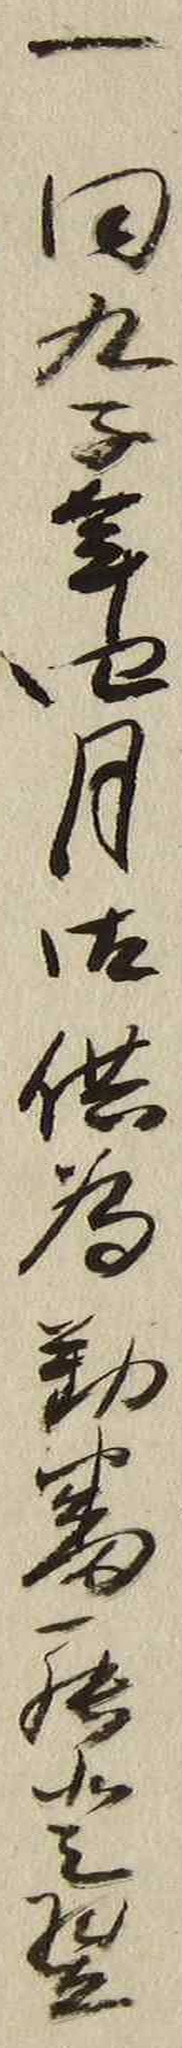一同九子年四月御供為勤番罷登翌
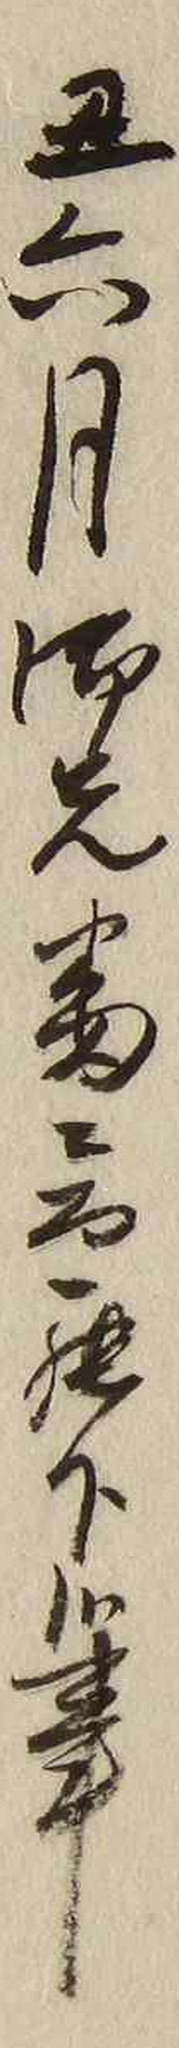丑六月御先番ニ而罷下候事
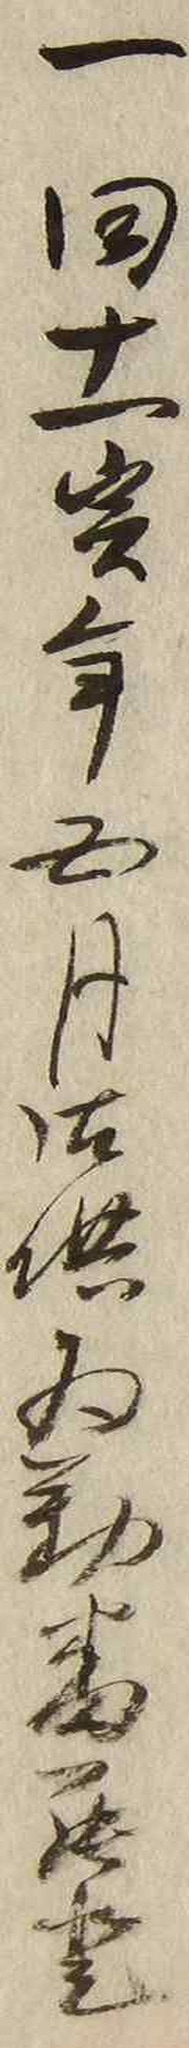一同十一寅年五月御供為勤番罷登

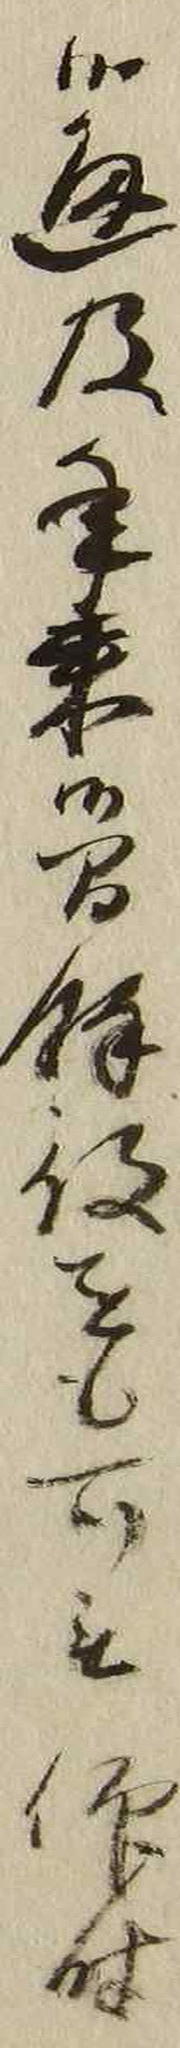候通及年来候間余役をも可被仰付
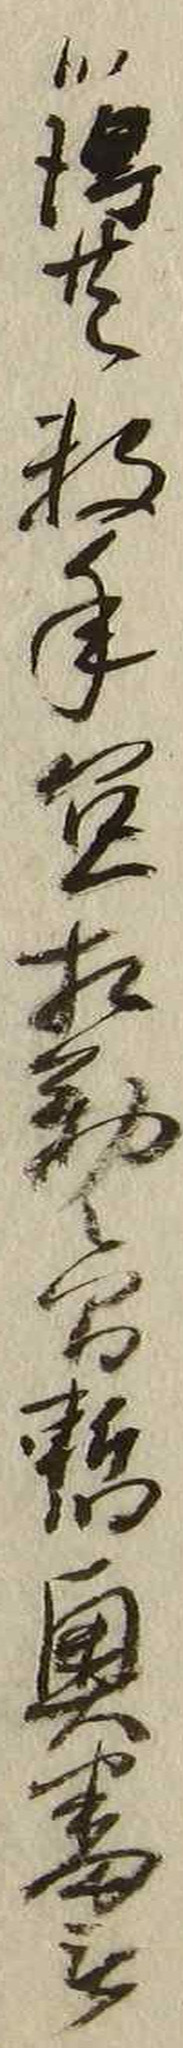候得共数年宜相勤候間暫奥番被
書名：諸士系譜　巻之346　も之部2
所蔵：会津若松市立会津図書館
